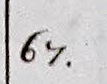67.
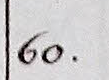60.
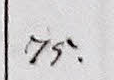75.
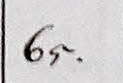65.
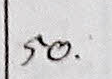50.
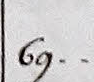69.
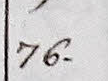76.
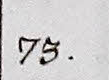73.
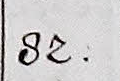32.
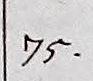75
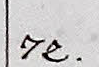72
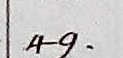49.
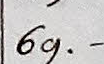69.
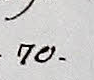70.
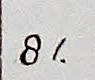81.
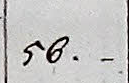56.
